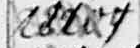28205
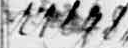27648
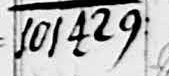101429
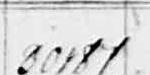30187
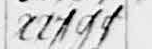22755
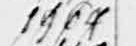1564
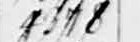4378
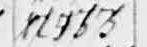12533
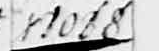13038
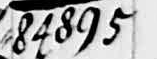84895
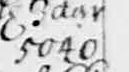5040
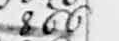866
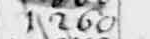1260
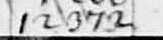12372
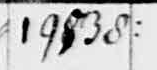19538
